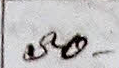50
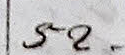52
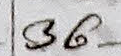36
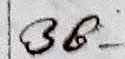36
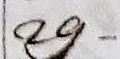29
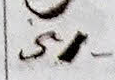51
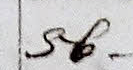56
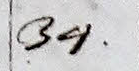34.
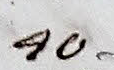40
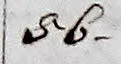56
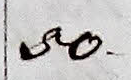50
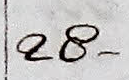28
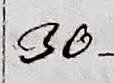30
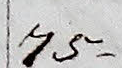75
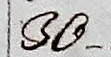30
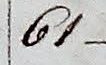61
